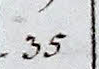35
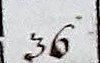36
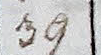39
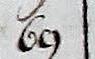69
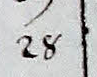28
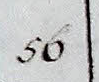56
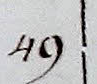49
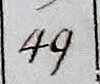49
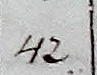42
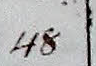48
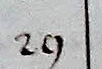29
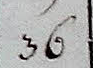36
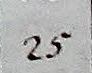25
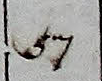57
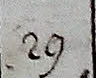29
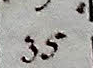35
